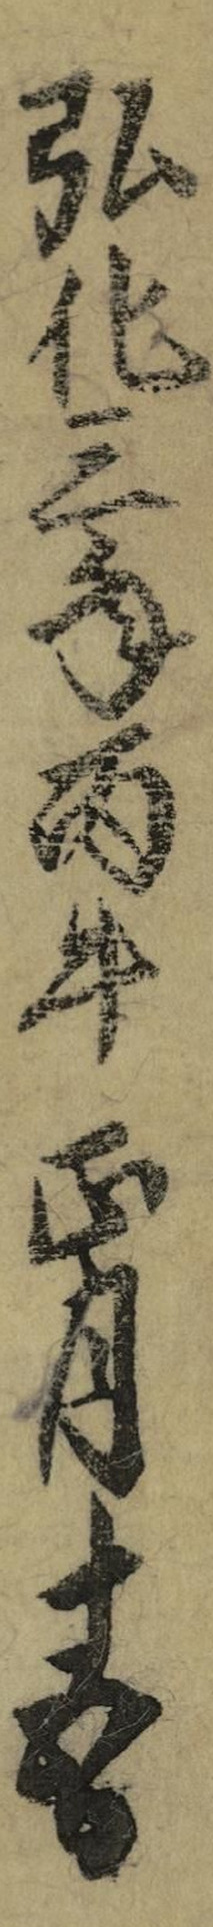弘化三年丙午正月十五日
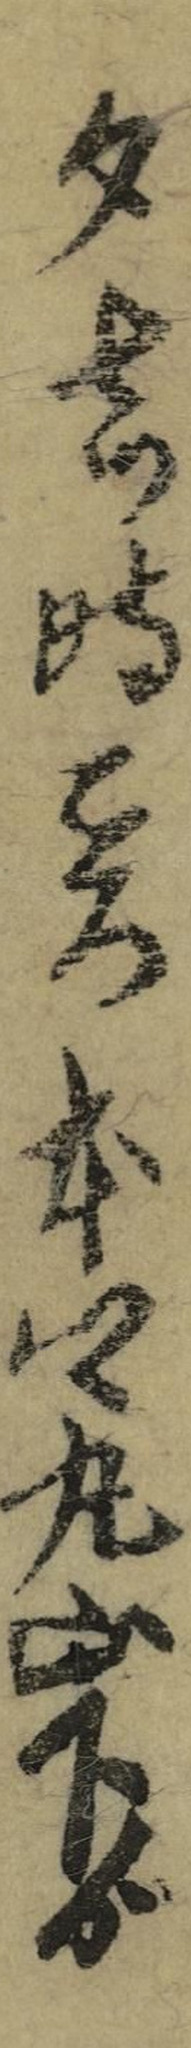夕七ツ時ころ本郷丸山下ゟ
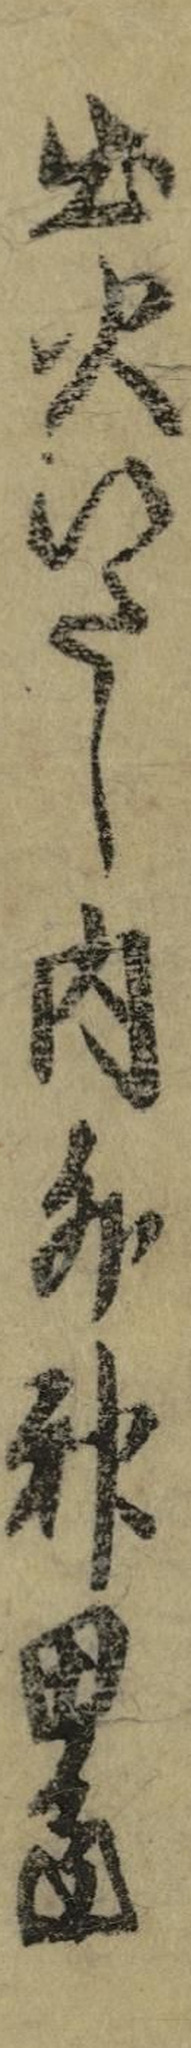出火いたし内外神田角
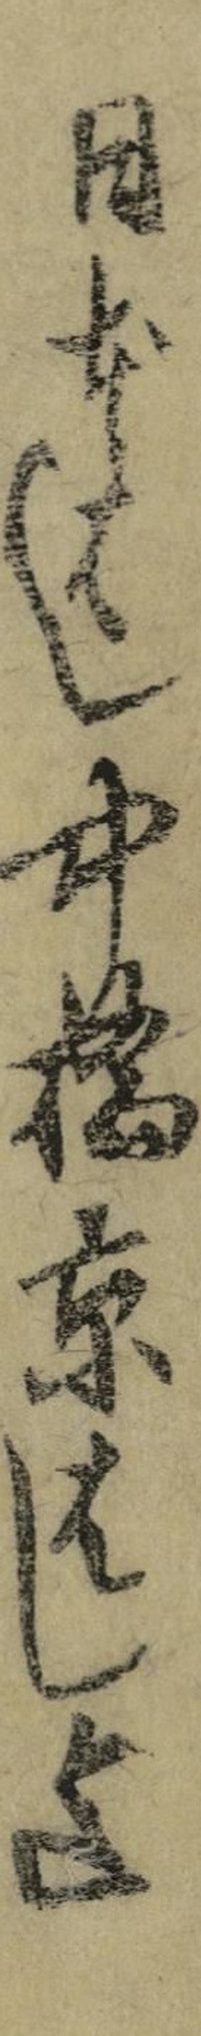日本はし中橋京はし迄
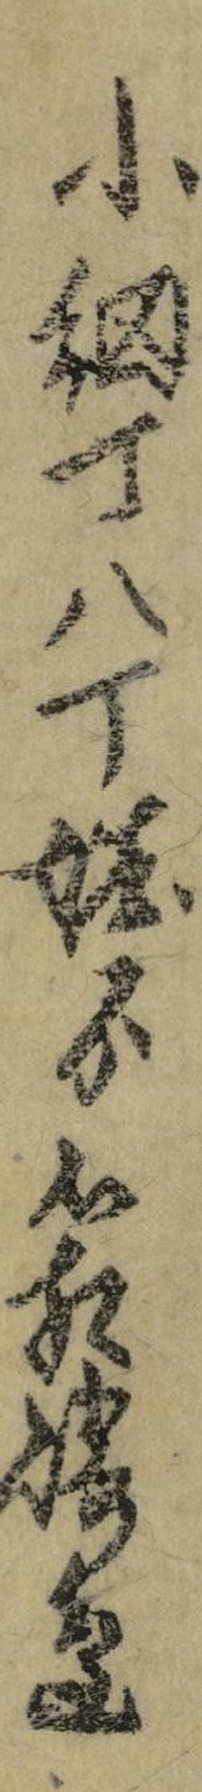小網丁八丁堀ゟ箱崎辺
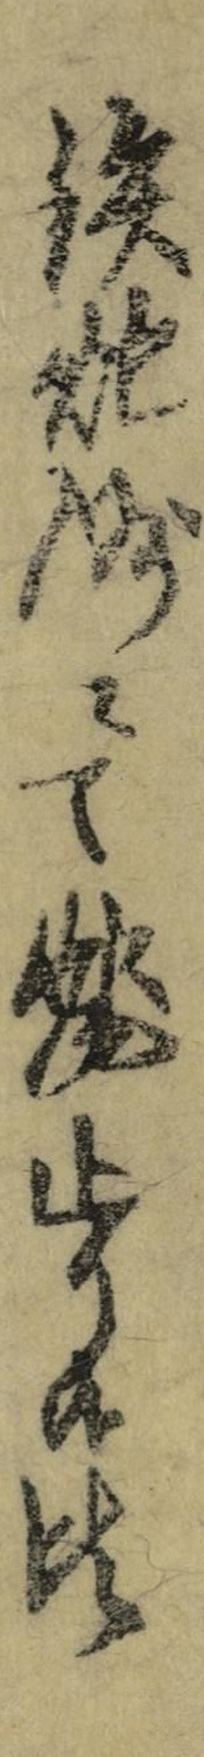鉄砲洲にて焼止り候頃
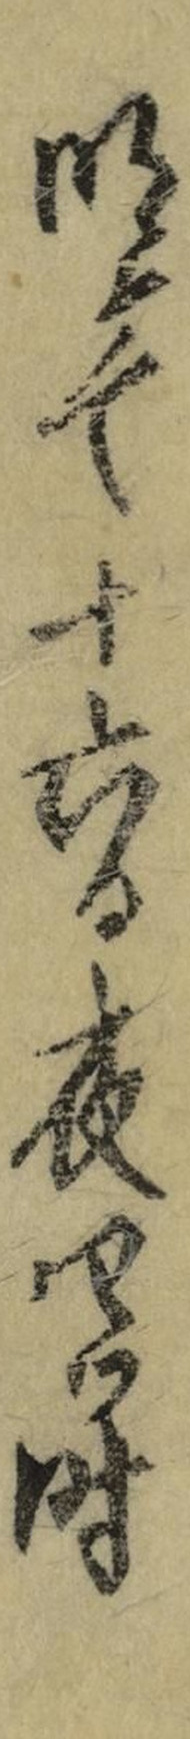明ケて十六日夜四ツ時
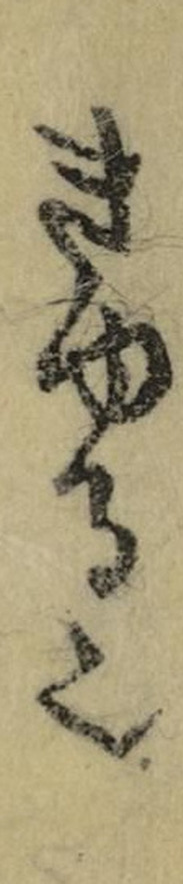きゆる也
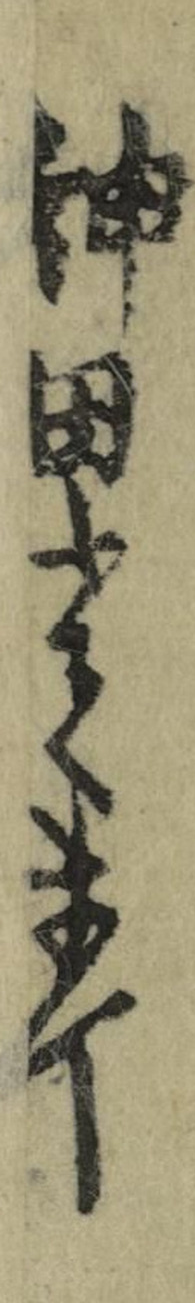神田はま丁
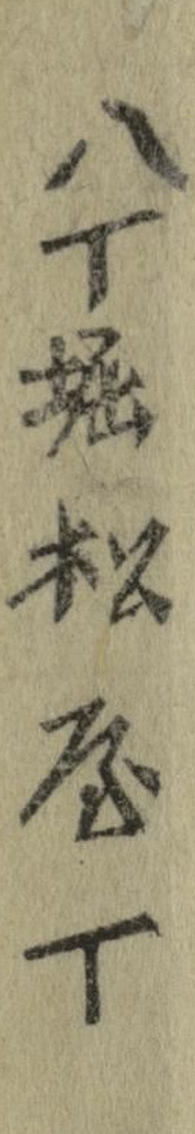八丁堀松屋丁
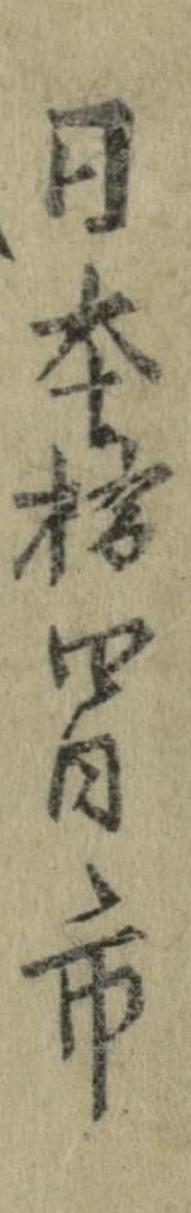日本橋四日市
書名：[弘化三年一月の江戸大火に関する瓦版]
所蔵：東京大学地震研究所図書室 Earthquake Research Institute Library, The University of Tokyo, JAPAN
